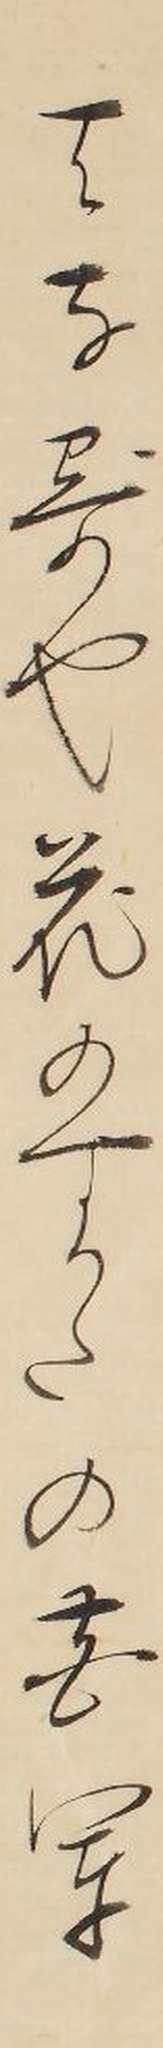はな寄や花のすかたの花軍
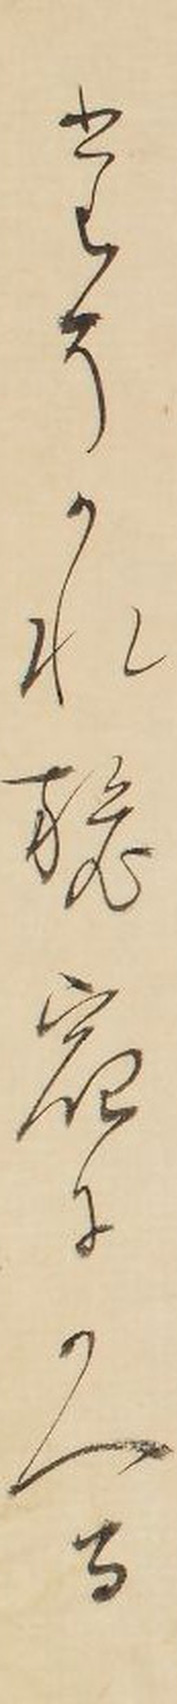たそかれ旅宿にかへる

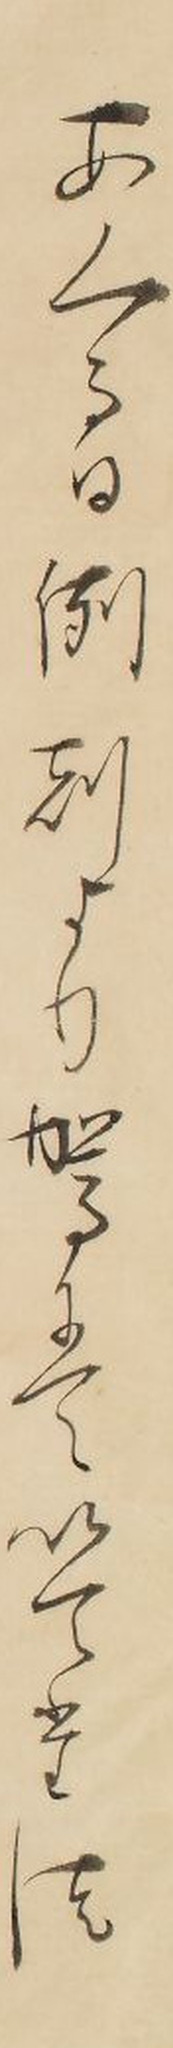あくる日例刻より駕にていてたつ
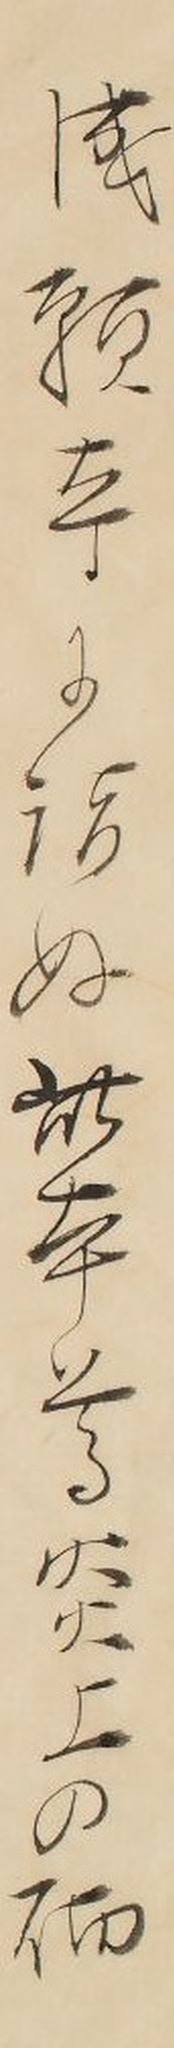成願寺に詣ぬ此本尊炎上の砌
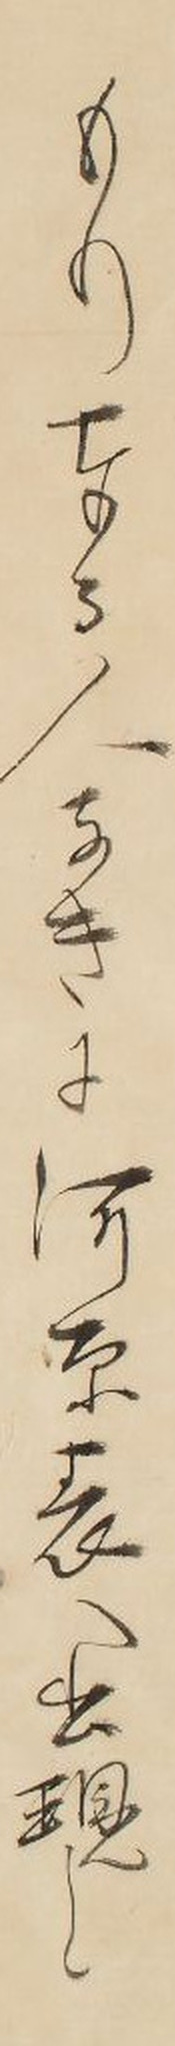もり奉る人なきに河原表へ出現し
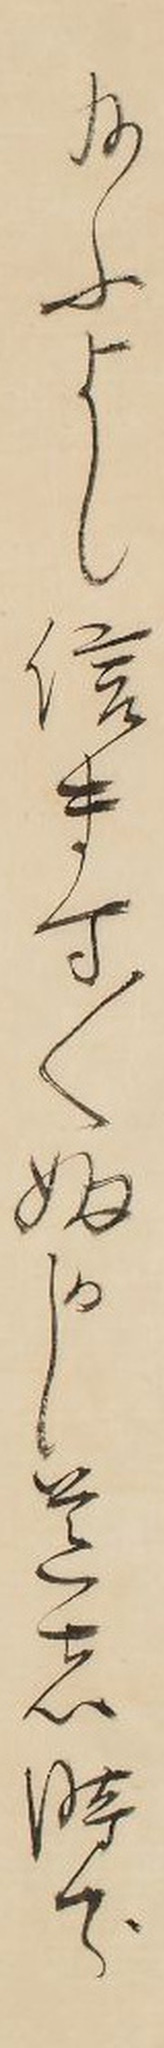給ふよし信ます〳〵ふかし道者時分
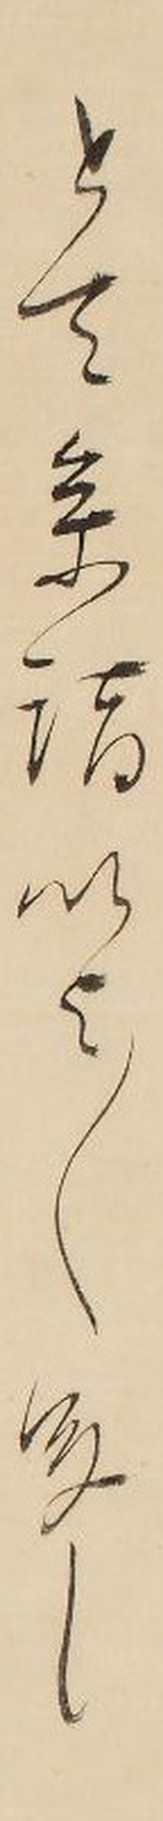とて参詣いよ〳〵多し
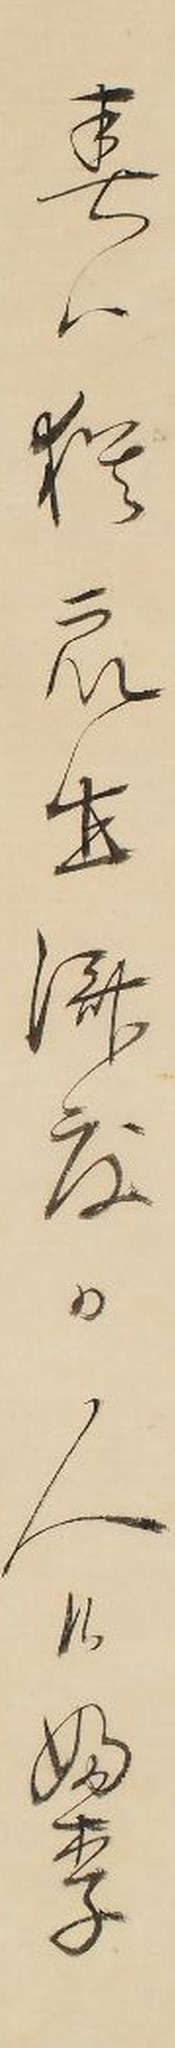春は猶衆生済度の人けふり
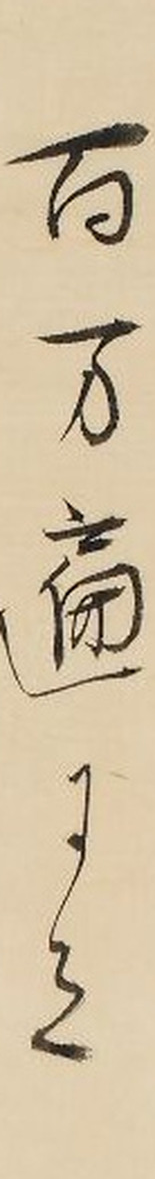百万遍にて
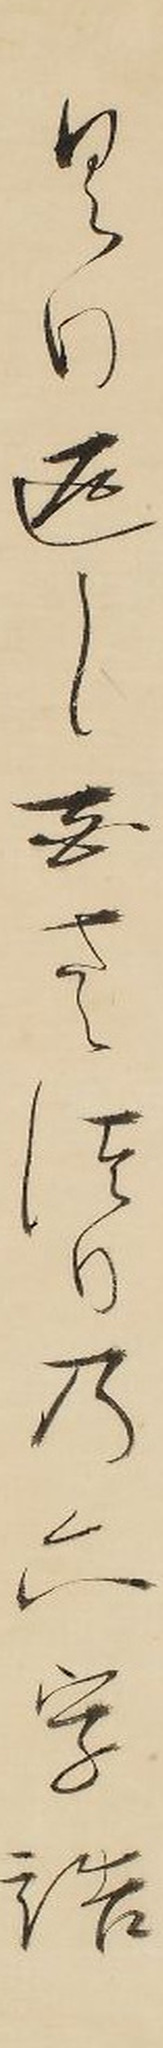くり返し百さえつりの六字詰
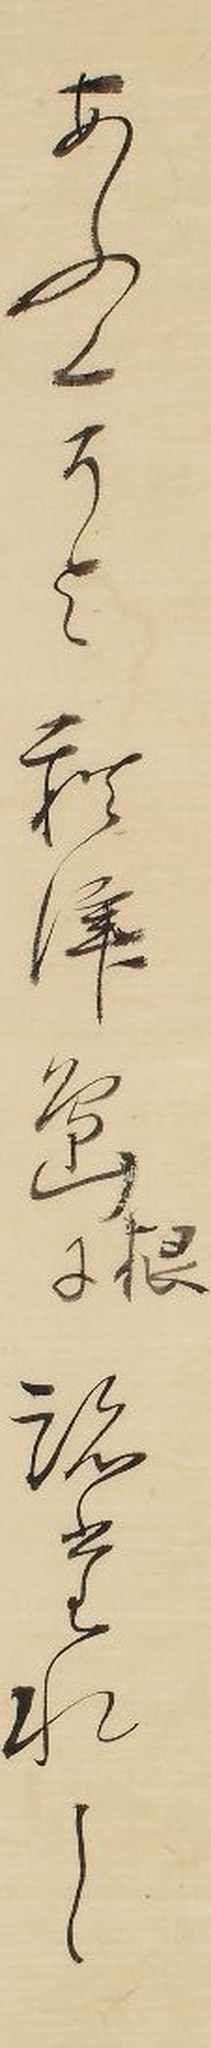あふくそと秋津島根に跡たれし
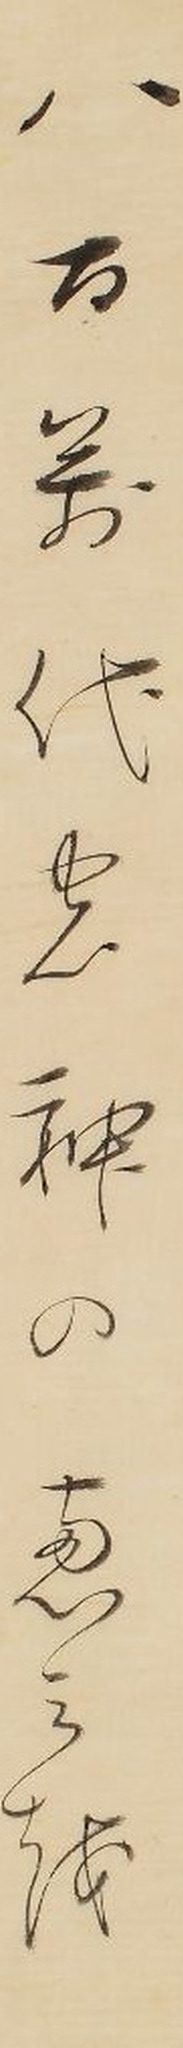八百万代の神の恵みを
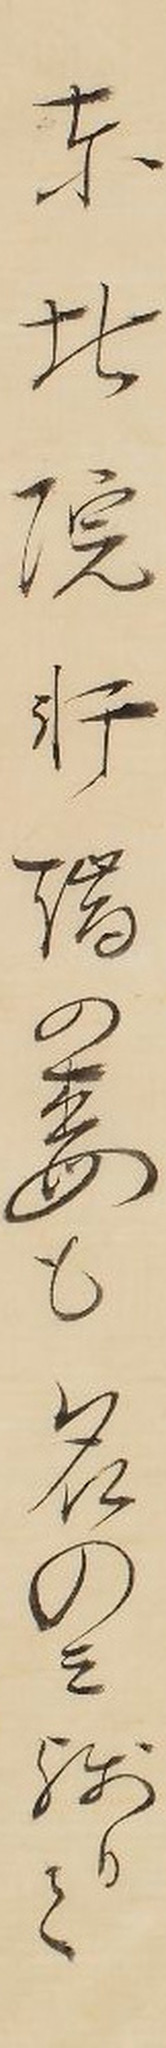東北院軒端の梅も名のみ残りて
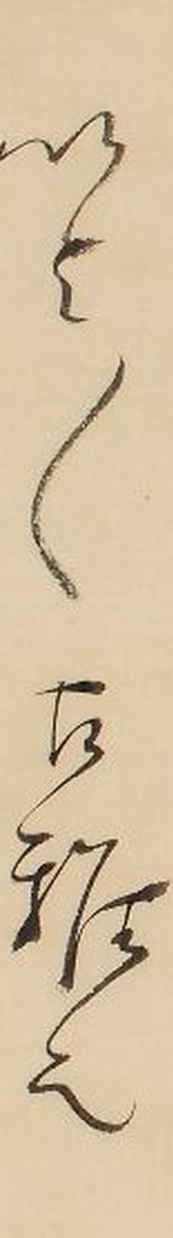いよ〳〵古雅也
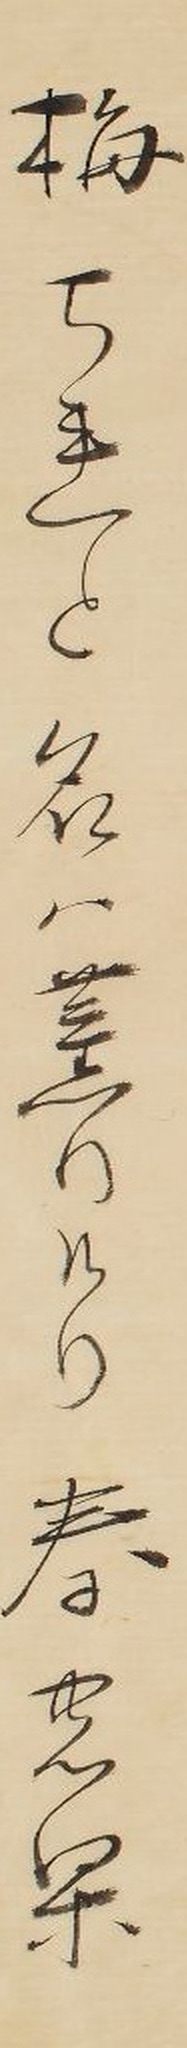梅ちれと名は薫りけり春の果
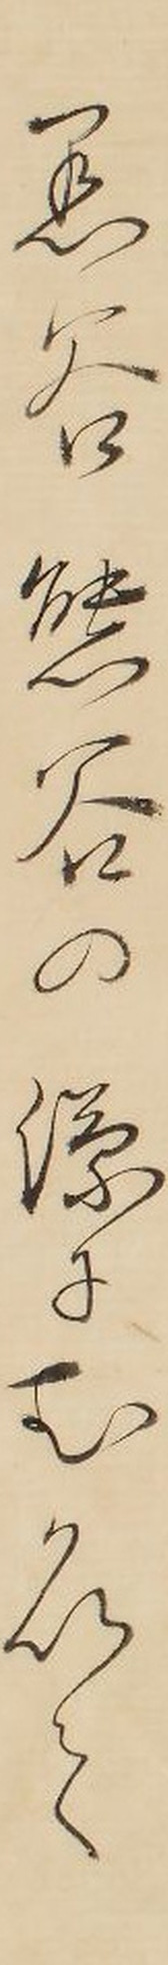黒谷熊谷の像にむかいて
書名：花土産
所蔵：徳島県立図書館
